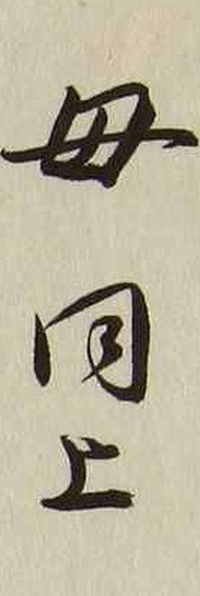母同上
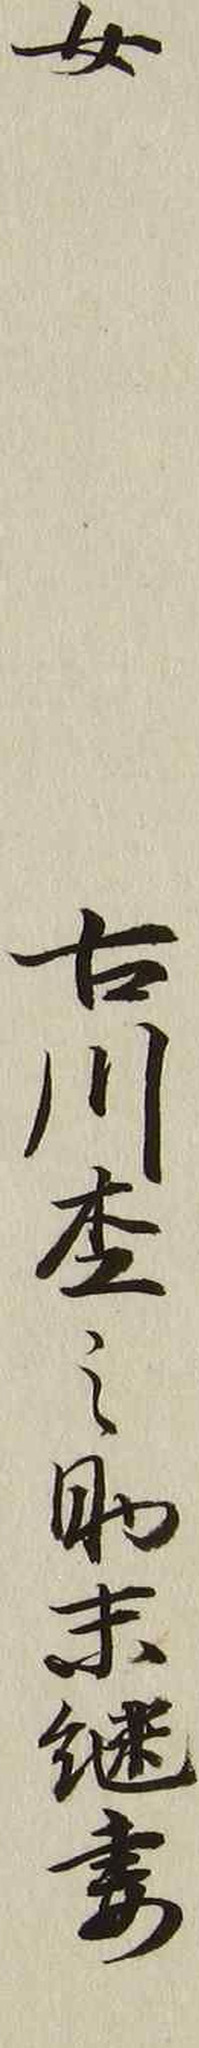女古川杢之助末継妻
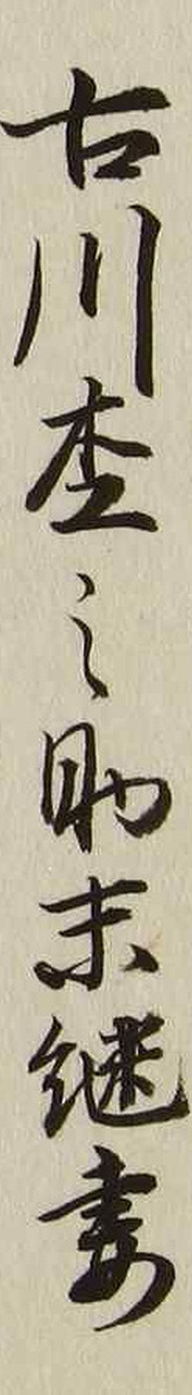女古川杢之助末継妻
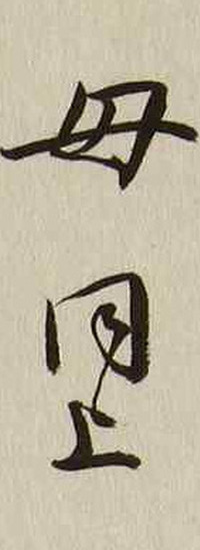母同上
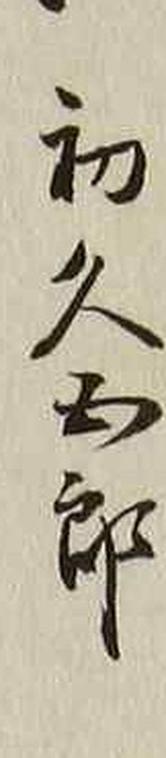初久五郎
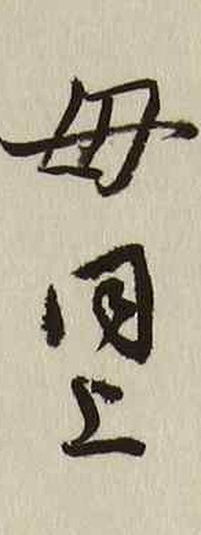母同上
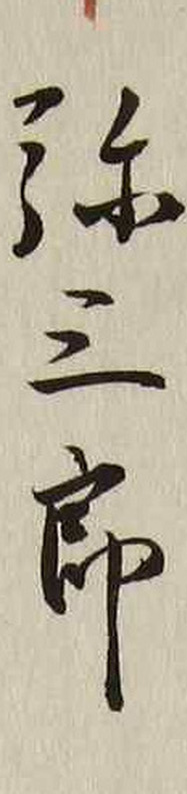弥三郎
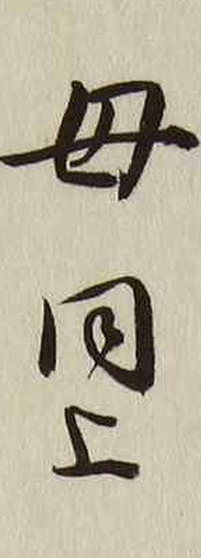母同上
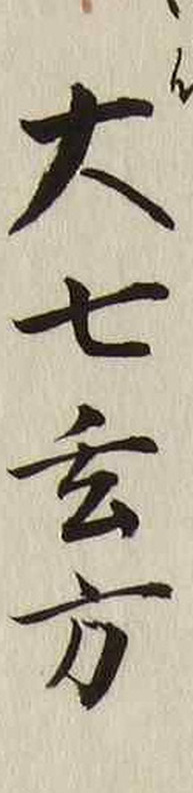大七玄方
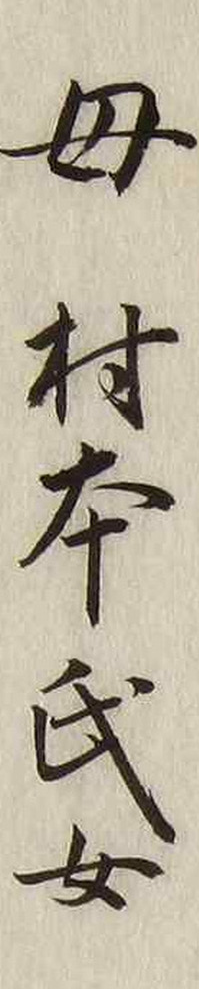母村本氏女
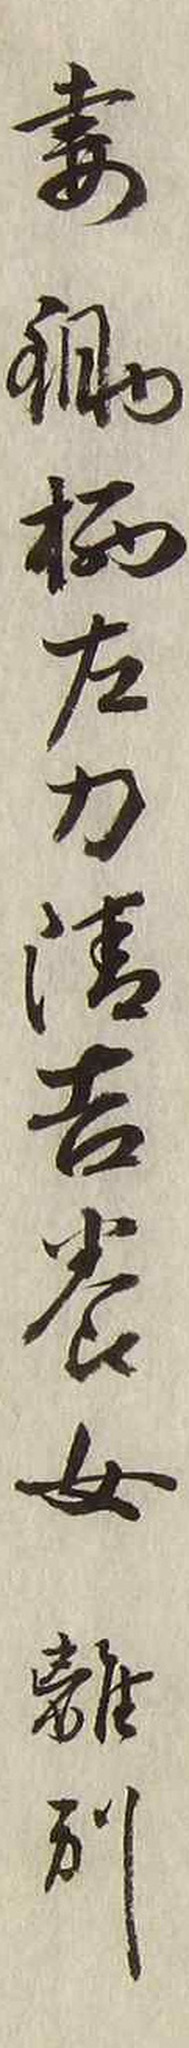妻鋤栖左刀清吉養女離別

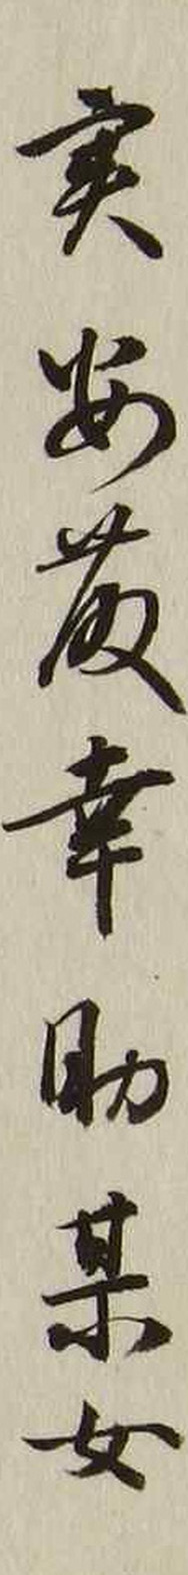実安藤幸助某女
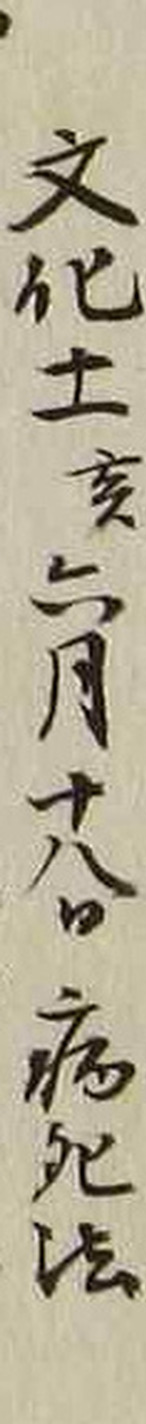文化十一亥六月十八日病死法
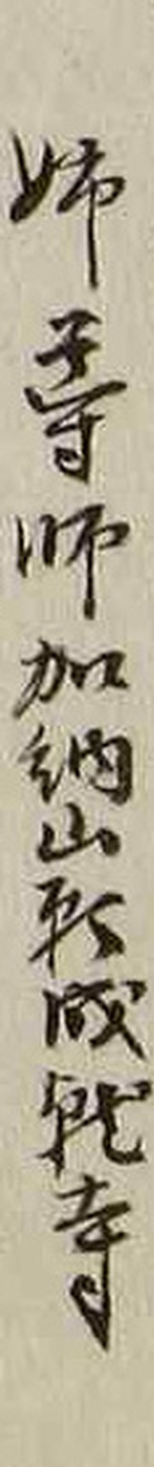姉導師加納山願成就寺
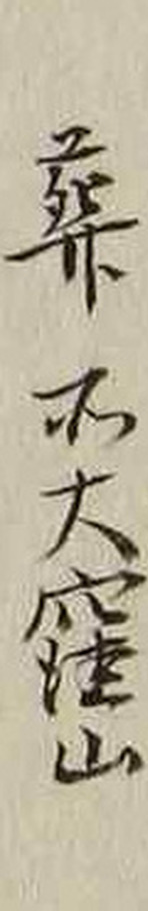葬所大窪山
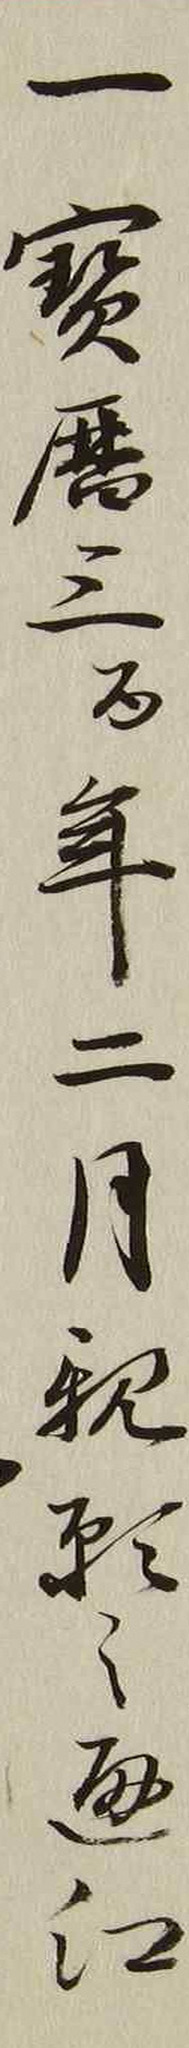一宝暦三酉年二月親願之通江
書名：諸士系譜　巻之19　い之部19
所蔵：会津若松市立会津図書館
